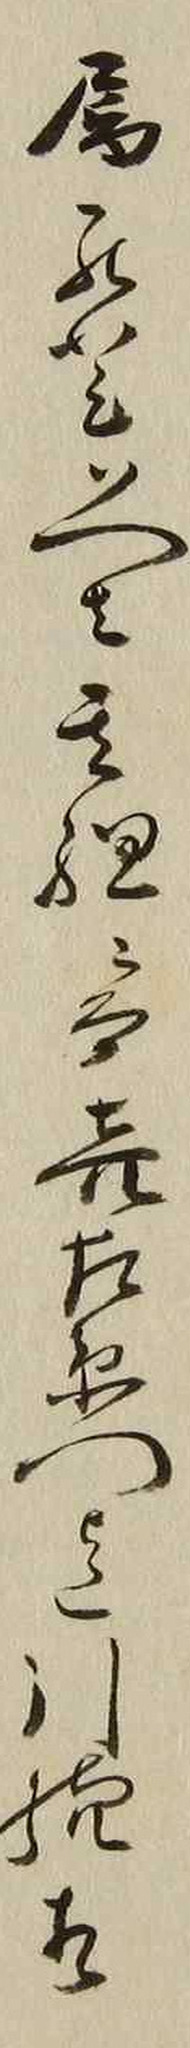属罷登候へ者其組ニ而喜左衛門迄引続相
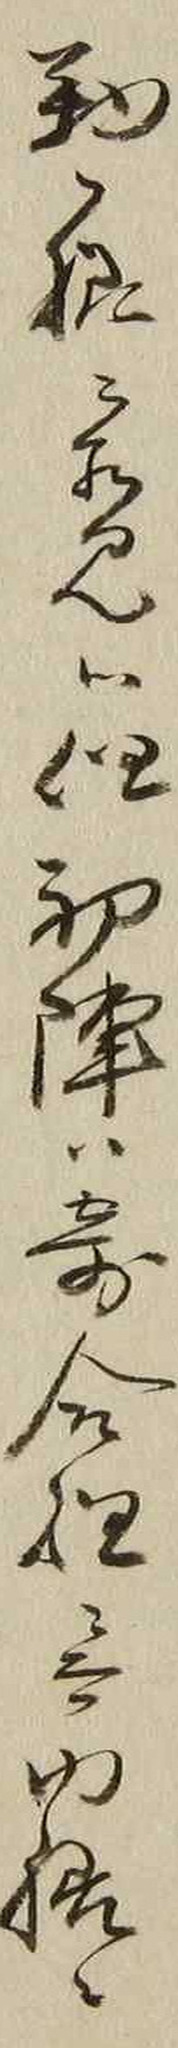勤候様ニ相見候組初陣ハ寄合組ニ而内膳ニ
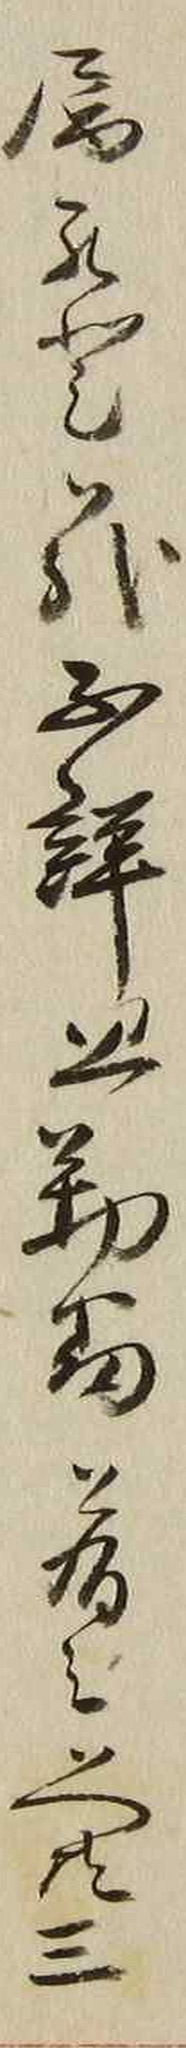属罷登候哉不詳且勤番と有之候へ共三
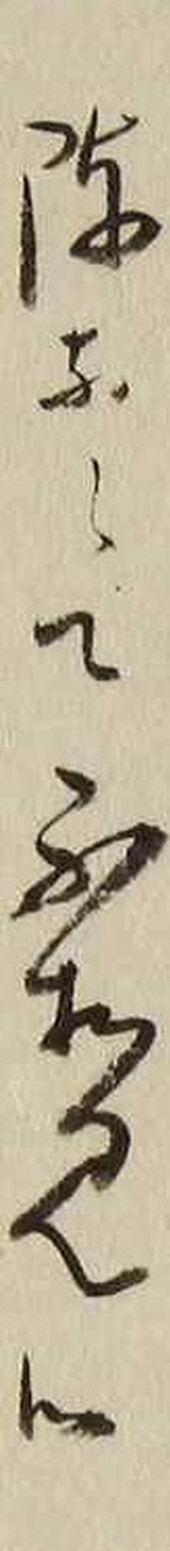陣なくて不相見候
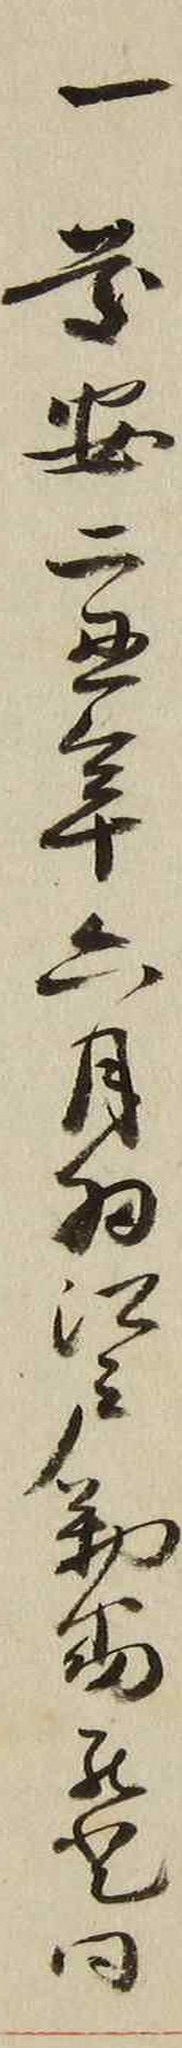一慶安二丑年六月為江戸勤番罷登同
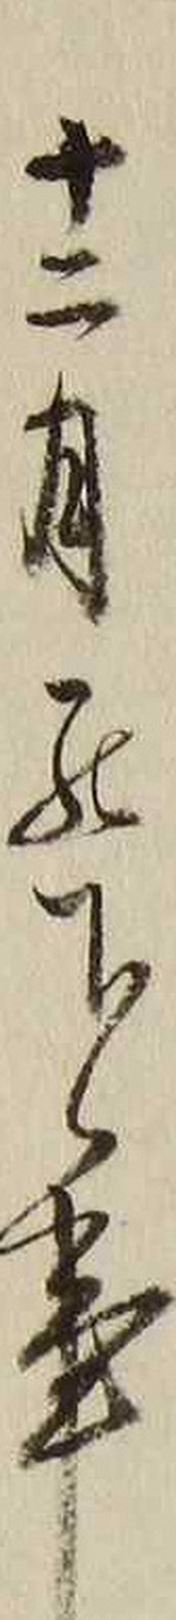十二月罷下候事
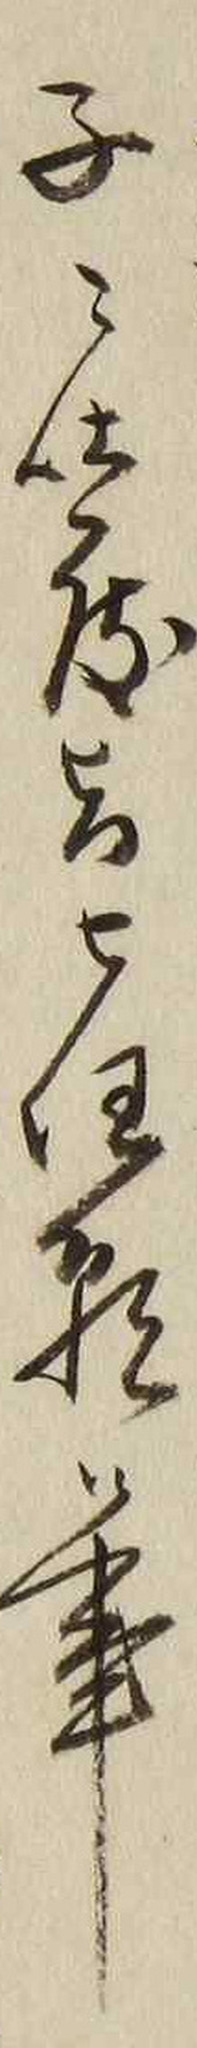子ニ仕度旨被任願候事
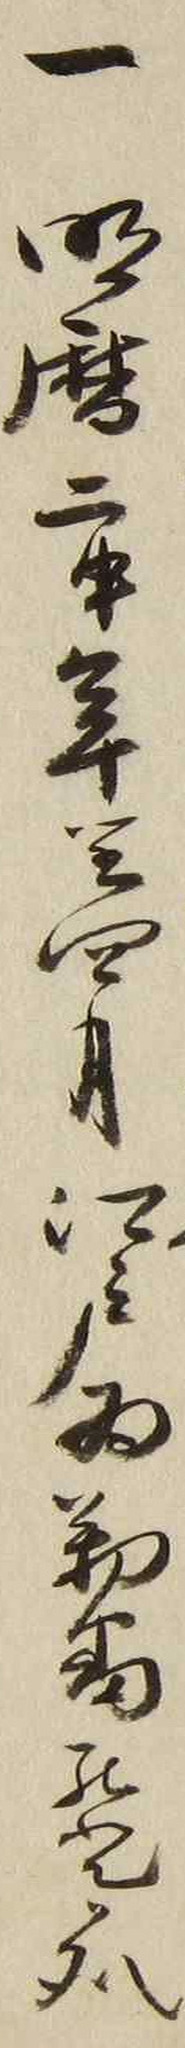一明暦二申年閏四月江戸為勤番罷登候処
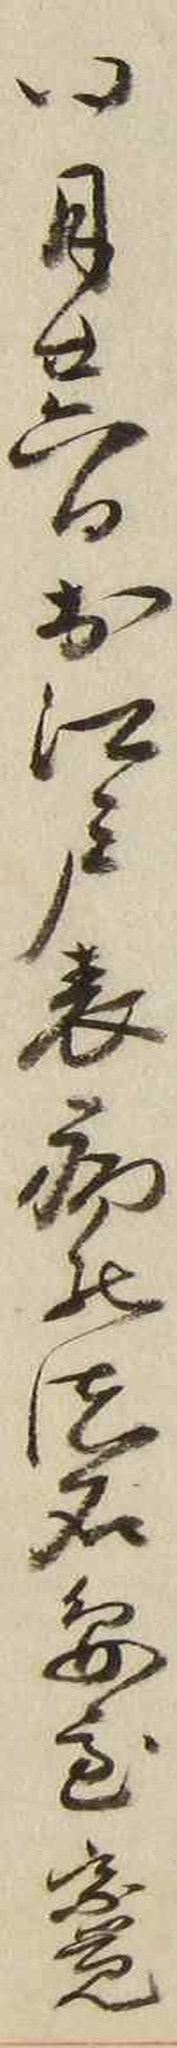同月廿六日於江戸表病死法名円宝宗覚

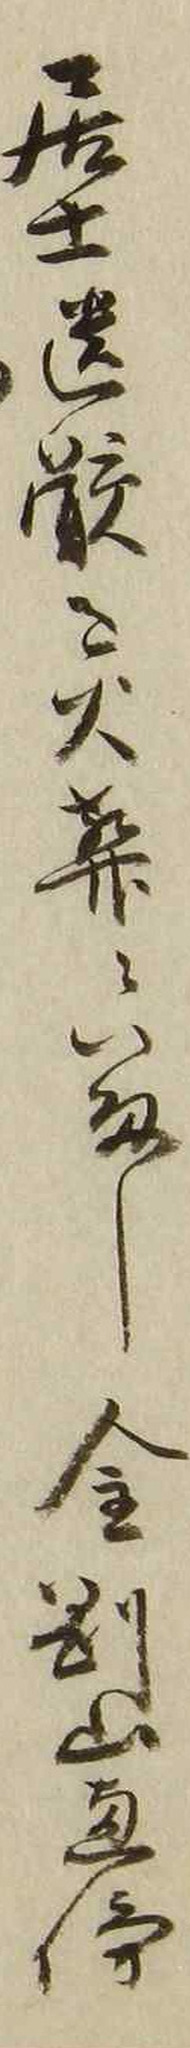居士遺骸を火葬ニいたし金剛山恵倫
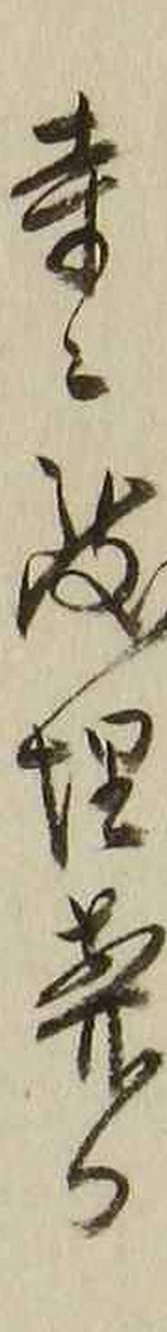寺ニ致埋葬候
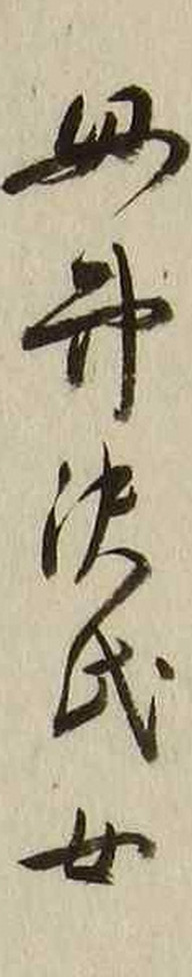母井沢氏女
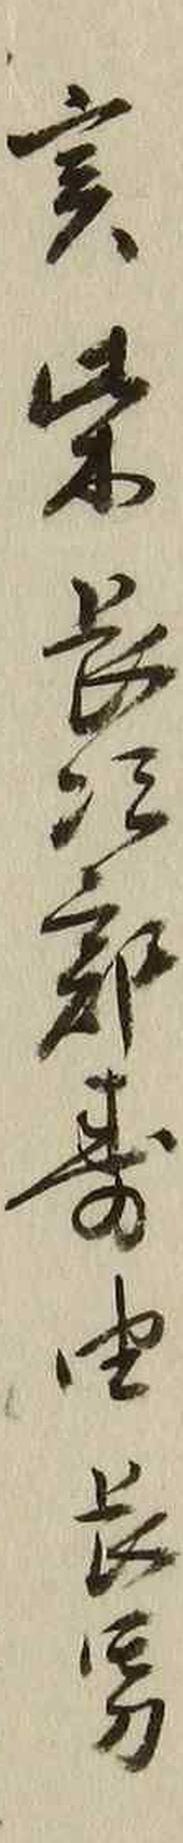実柴長次郎寿由長男
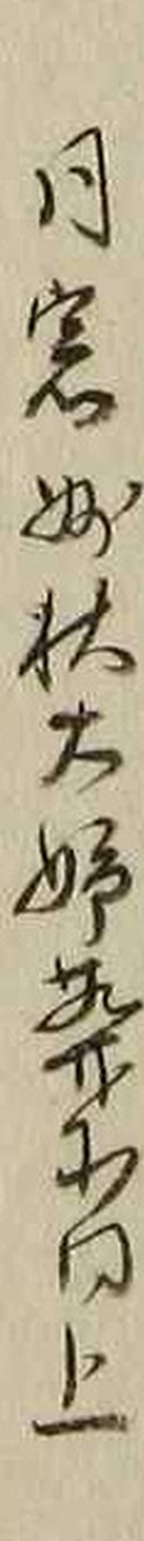月窓妙秋大姉葬所同上
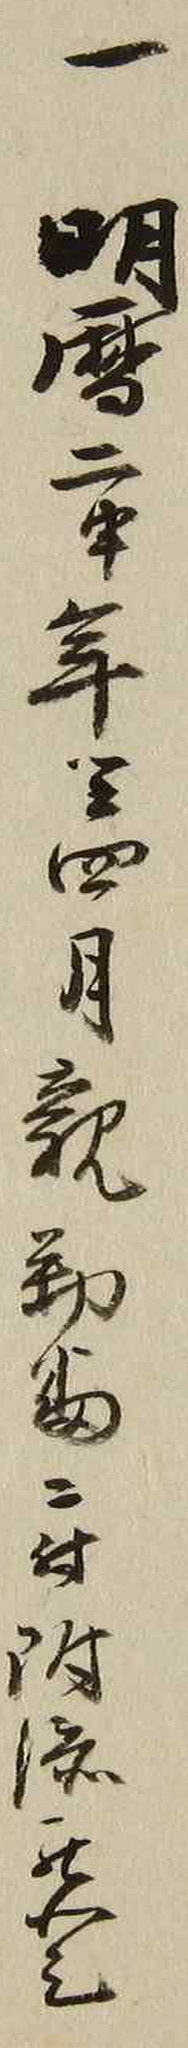一明暦二申年閏四月親勤番ニ付附添罷登
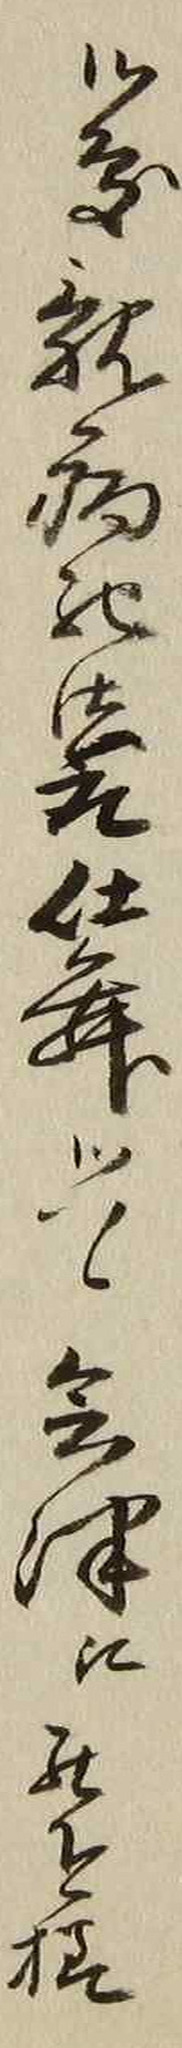候処親病死仕取仕舞候ハヽ会津江罷下候様
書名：諸士系譜　巻之311　し之部1
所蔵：会津若松市立会津図書館
